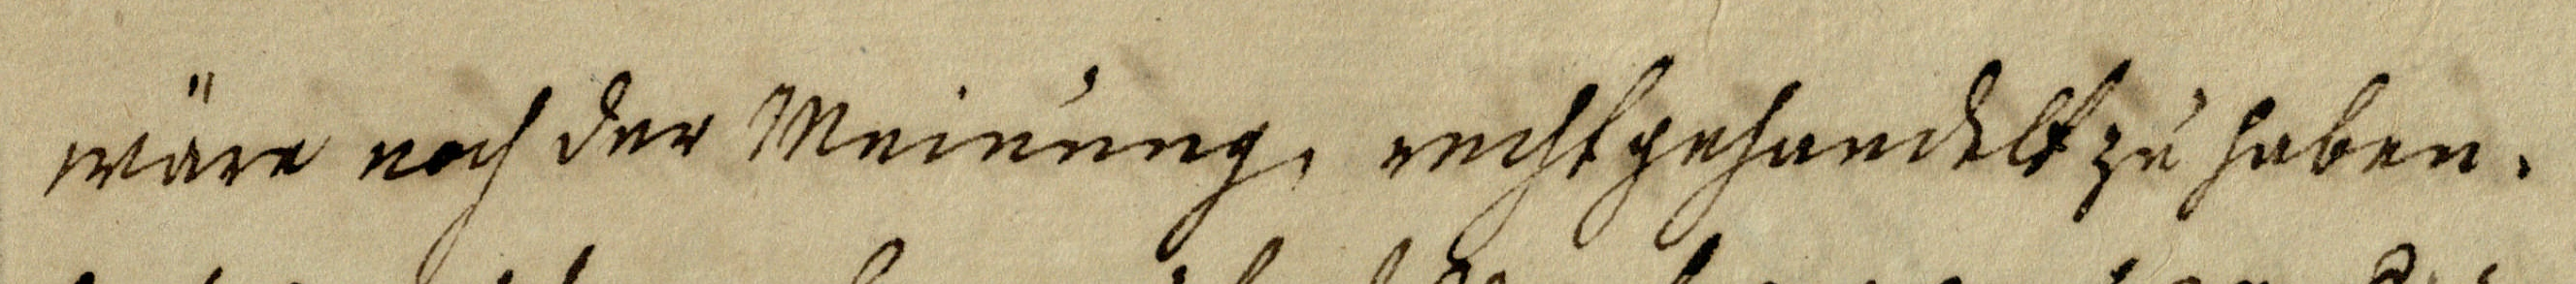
wäre noch der Meinung, recht gehandelt zu haben.
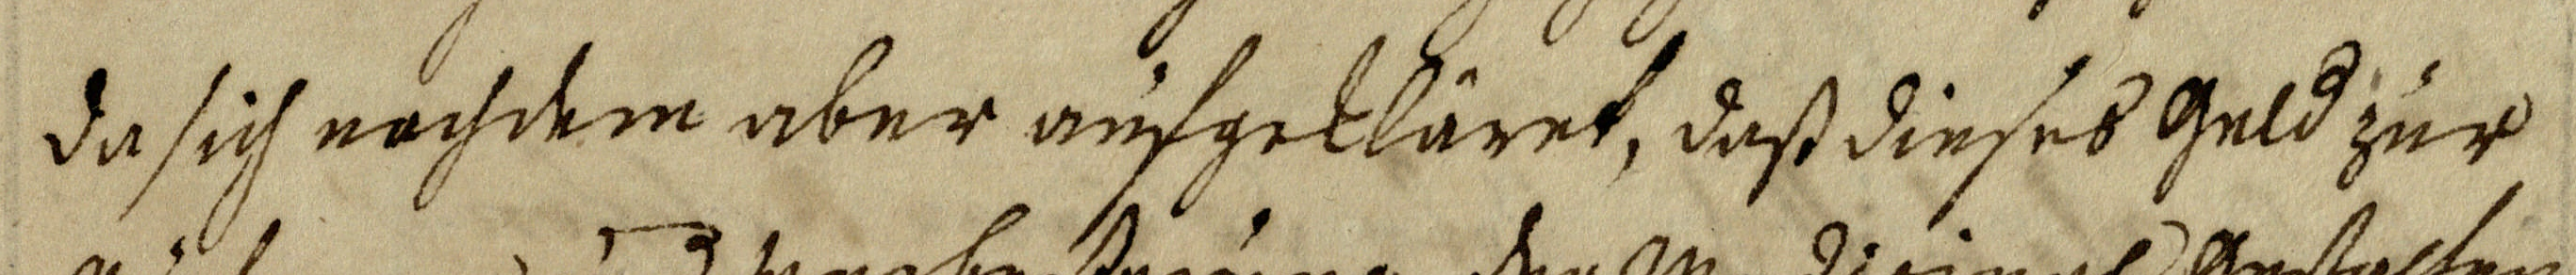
Da sich nachdem aber aufgekläret, daß dieses Geld zur
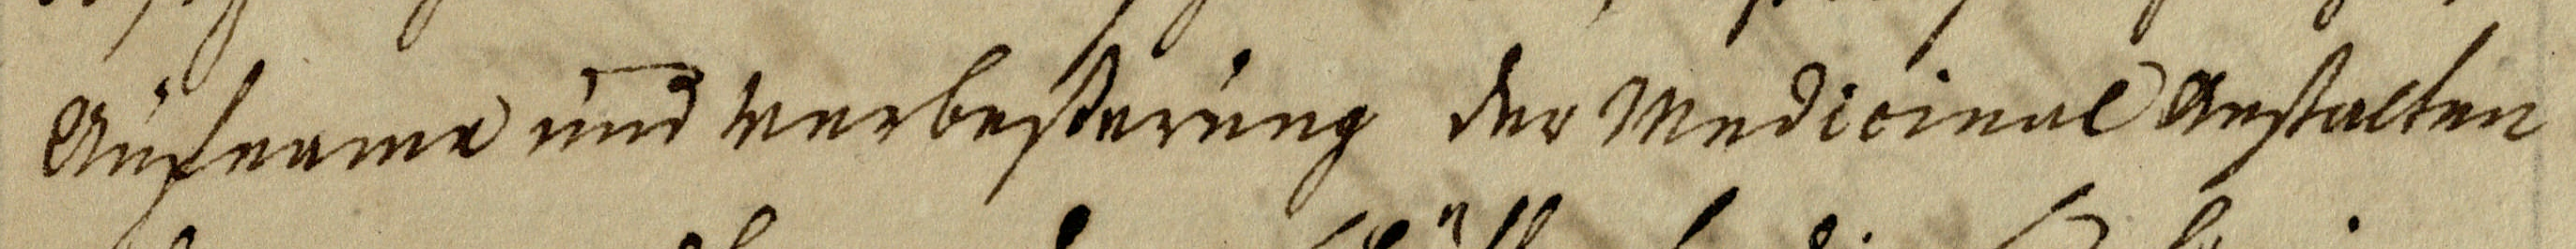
Aufname und Verbeßerung der Medicinal Anstalten
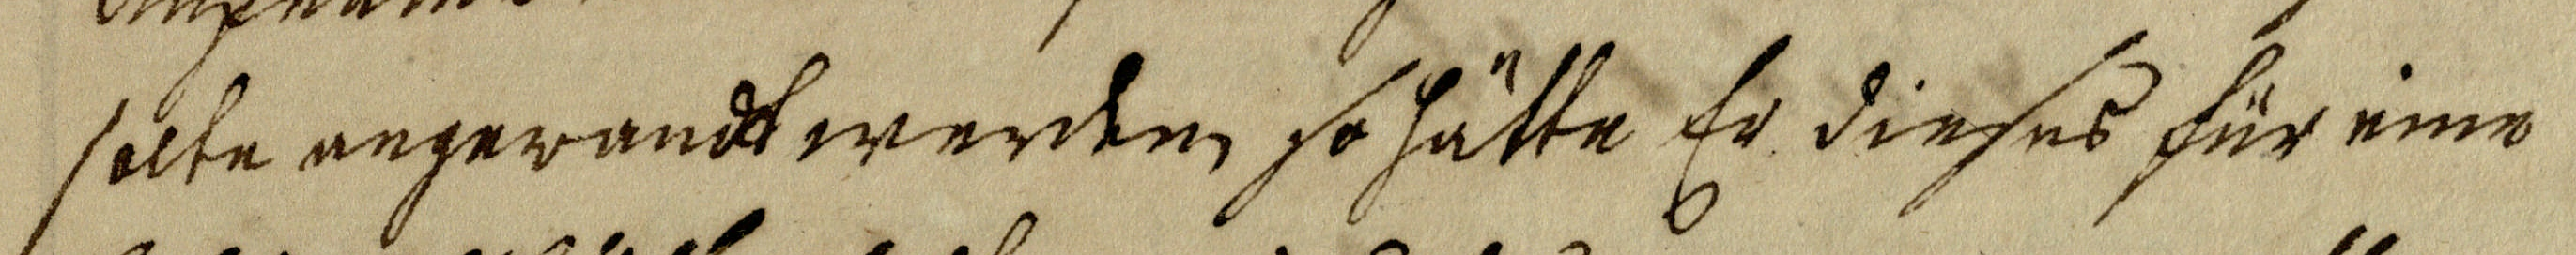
solte angewandt werden, so hätte Er dieses für eine
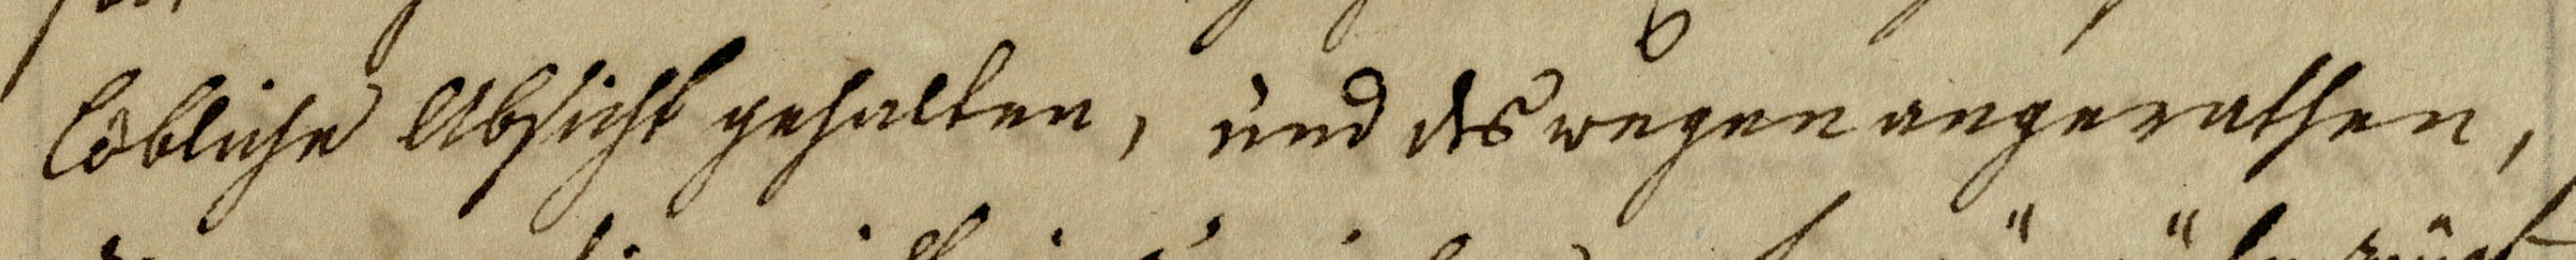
löbliche Absicht gehalten, und des wegen angerathen,
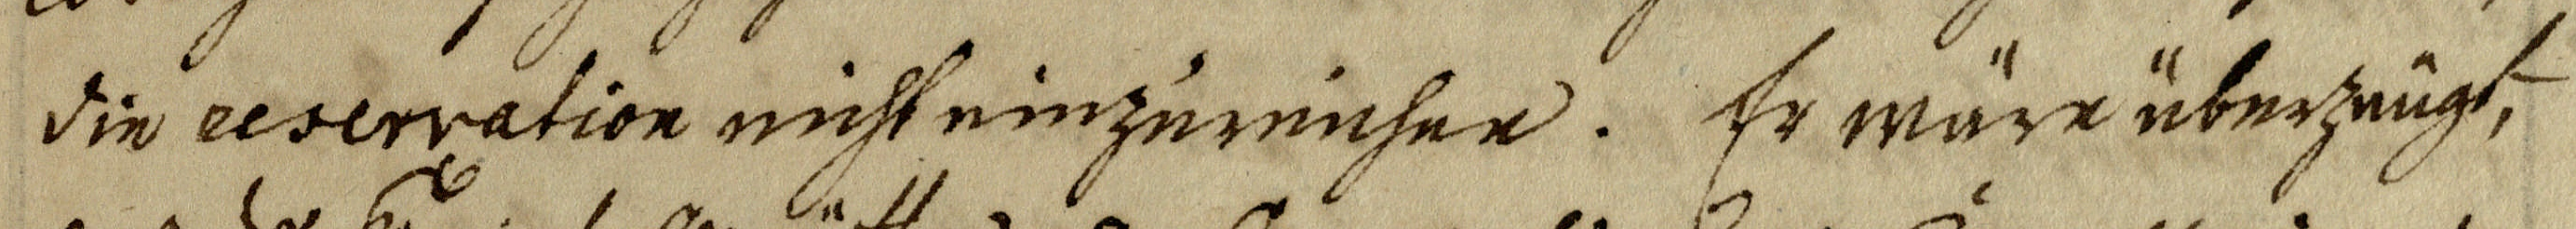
die reservation nicht einzureichen. Er wäre überzeugt,
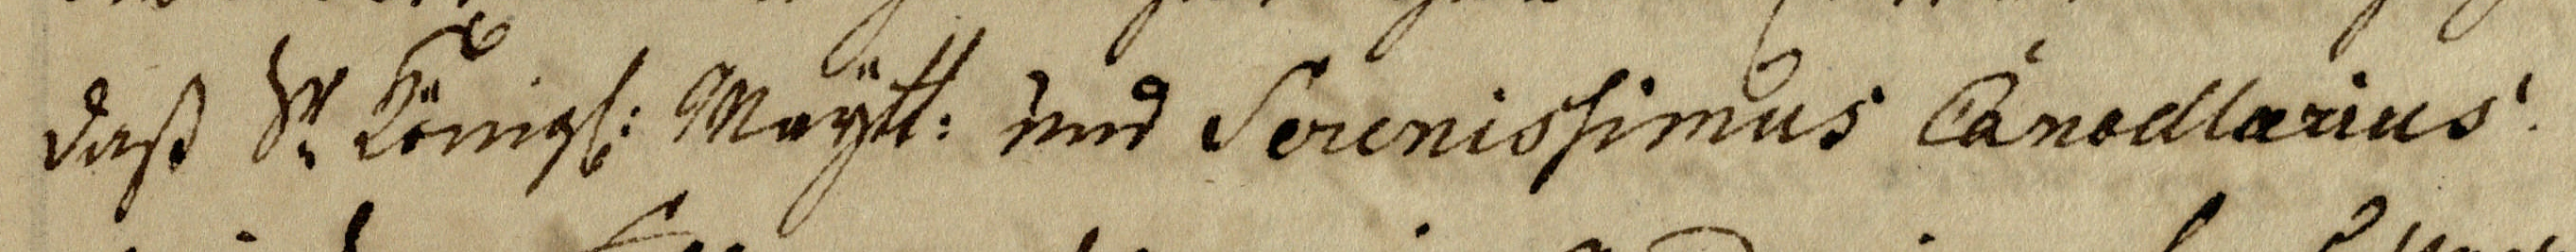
daß Sr. Königl. Maÿtt. und Serenissimus Cancellarius
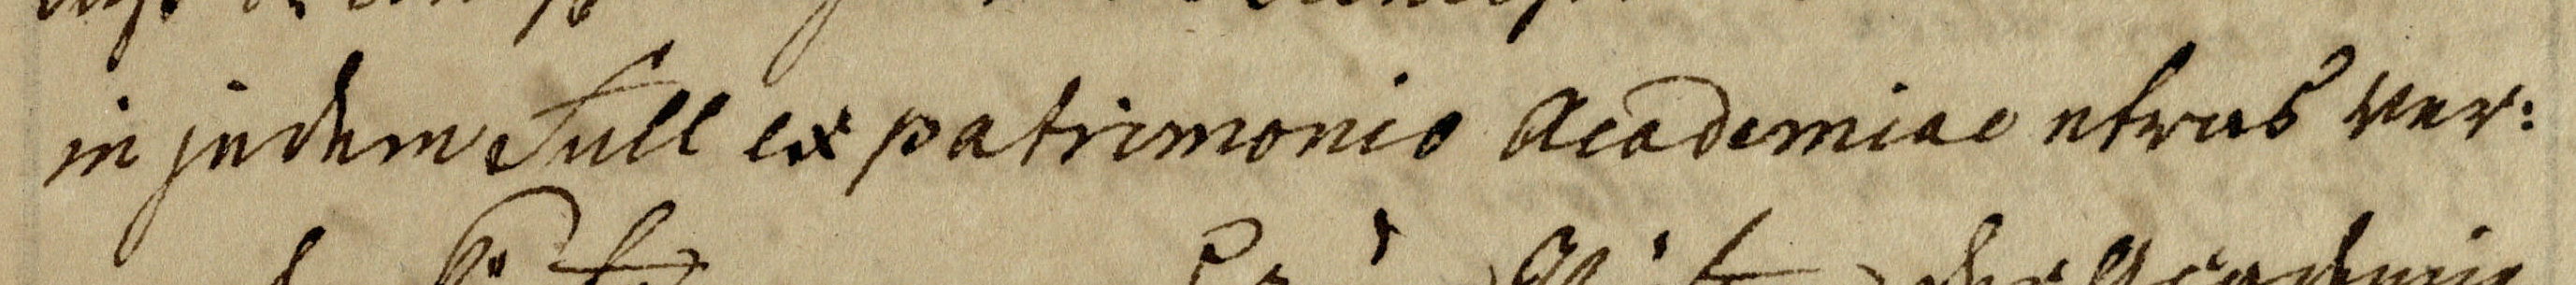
im jedem Fall ex patrimonio Academiae etwas ver¬
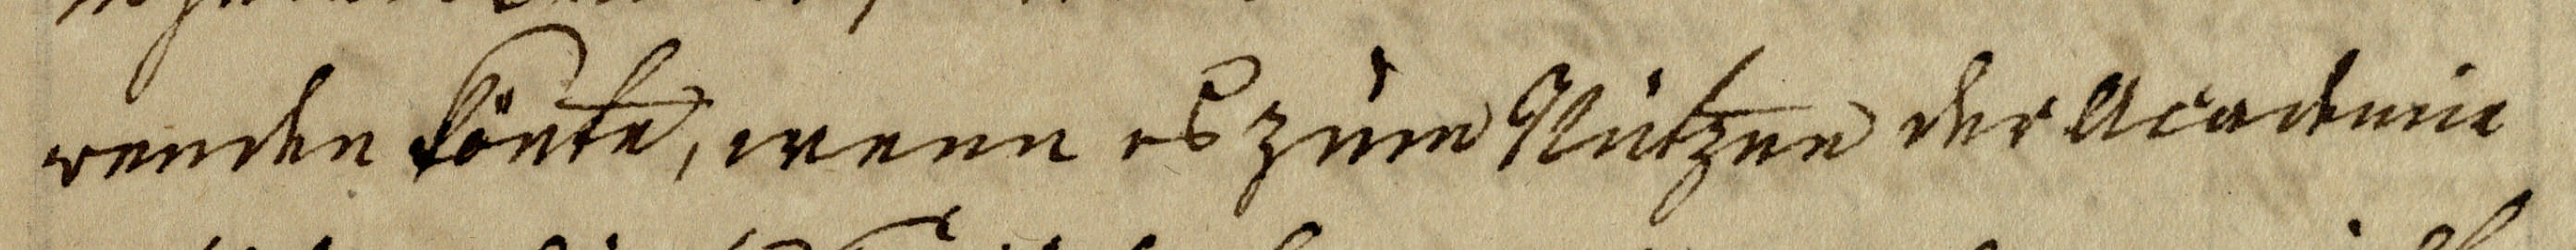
wenden könte, wenn es zum Nutzen der Academie
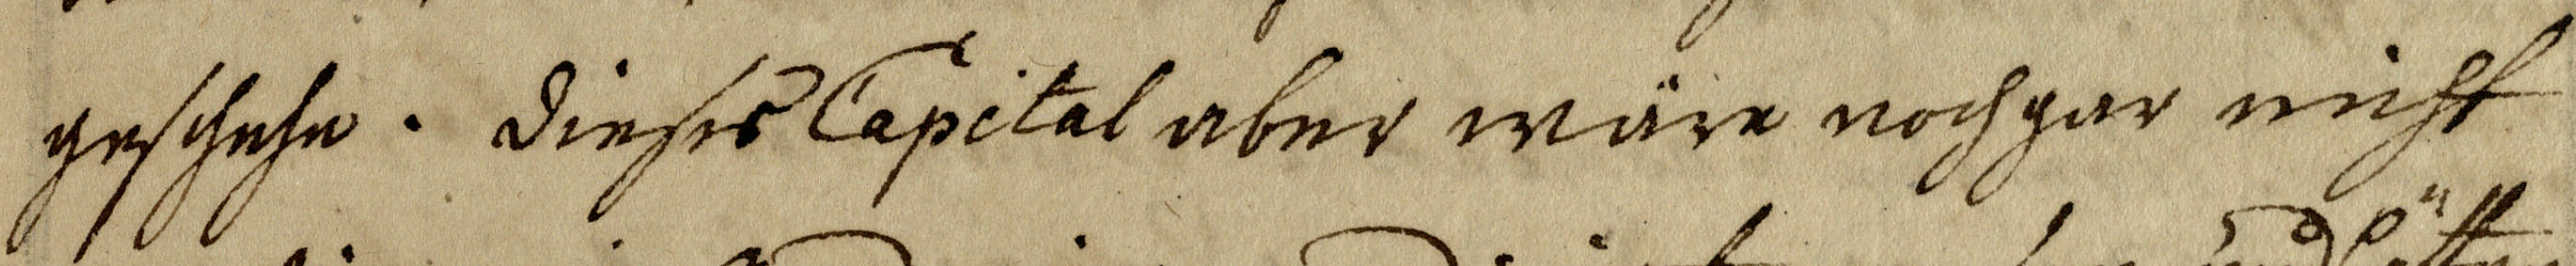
geschehe. Dieses Capital aber wäre noch gar nicht
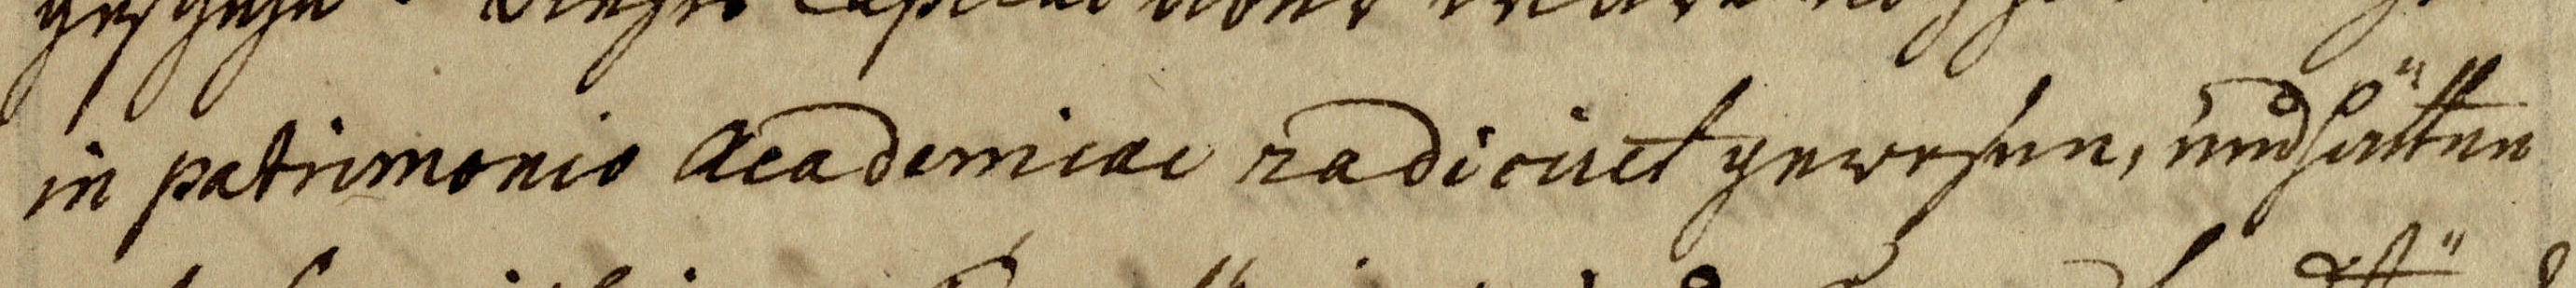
in patrimonio Academiae radiciret gewesen, und hätten
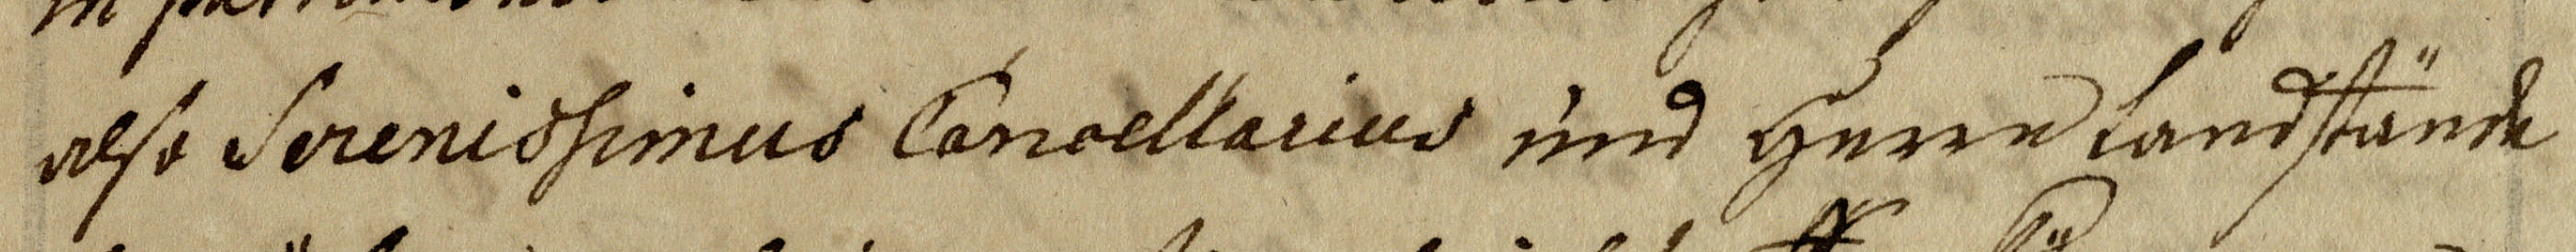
also Serenissimus Cancellarius und Herrn Landstände
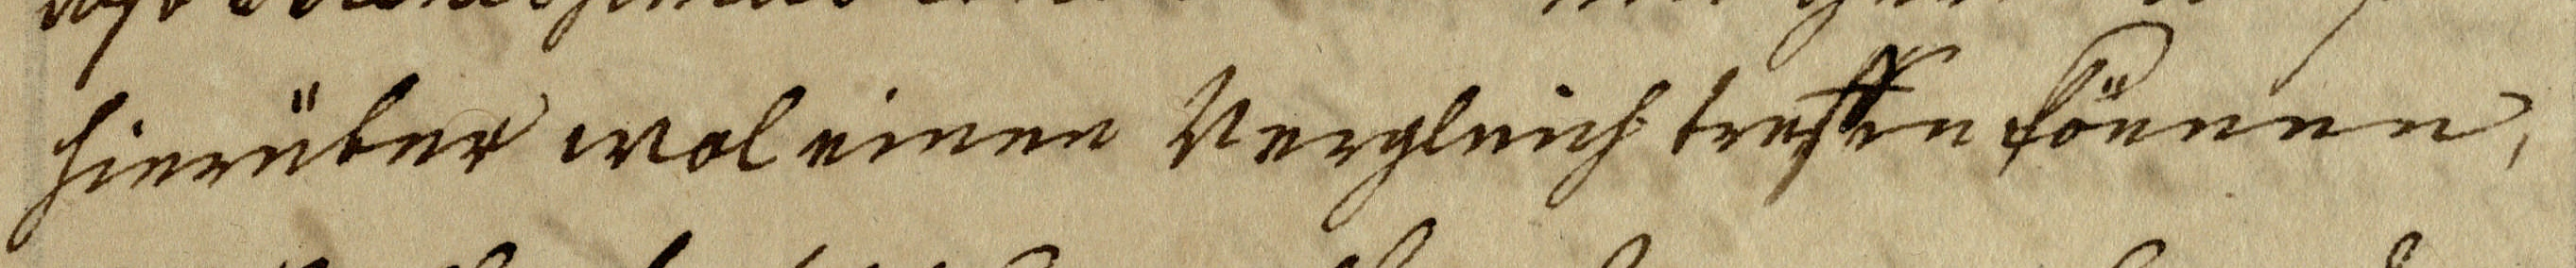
hierüber wohl einen Vergleich treffen können,
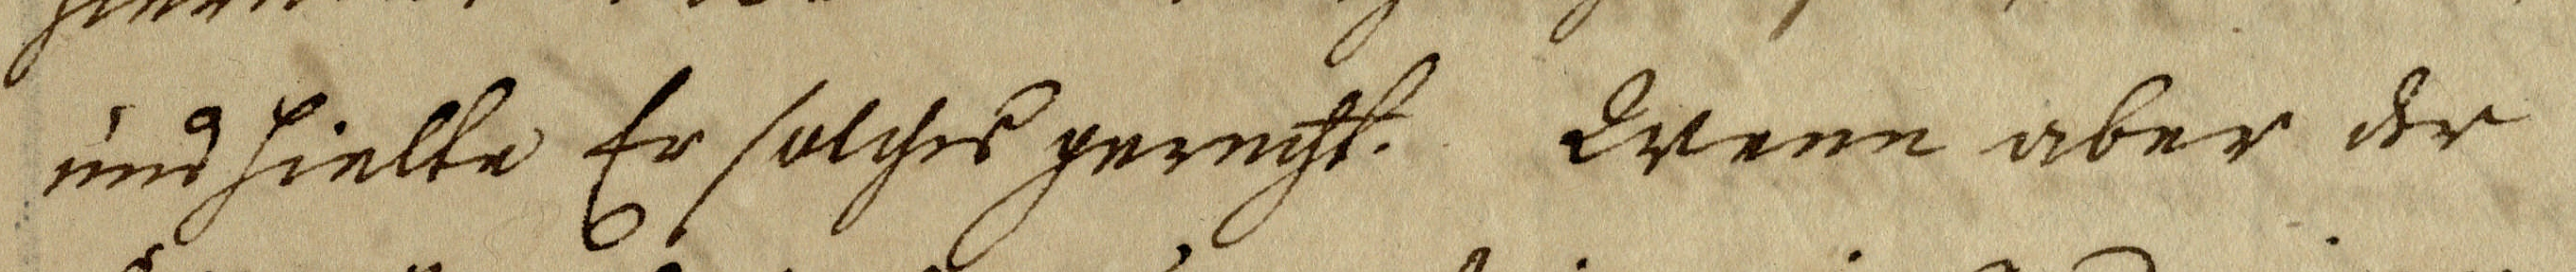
und hielte Er solches gerecht. Wenn aber der
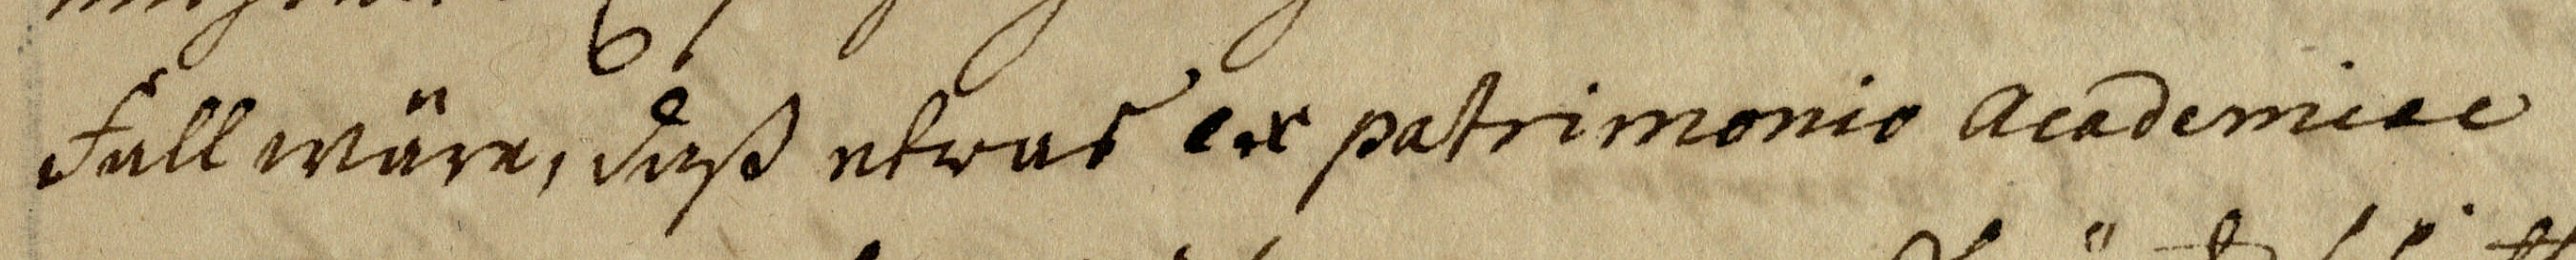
Fall wäre, daß etwas ex patrimonio Academiae
